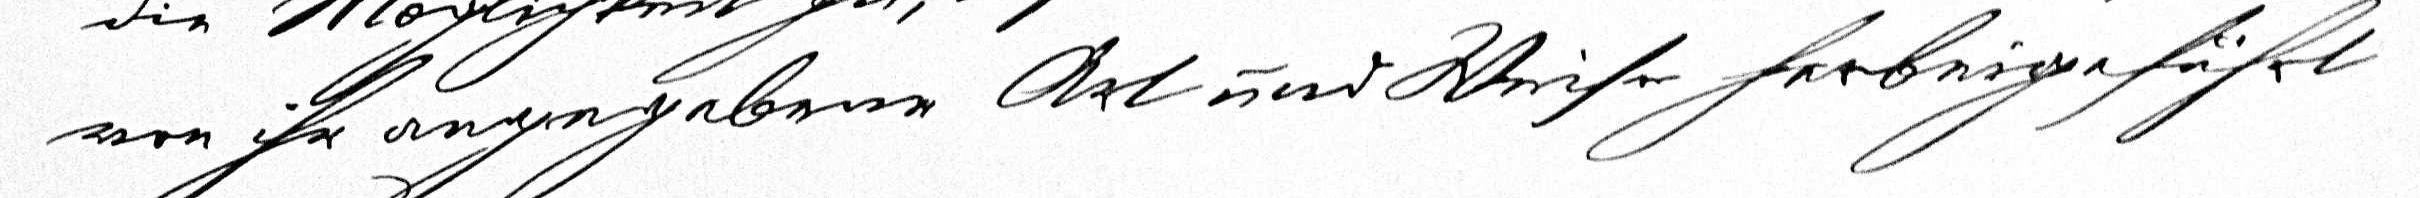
ver ihr angegebene Art und Weise Herbeigefährt
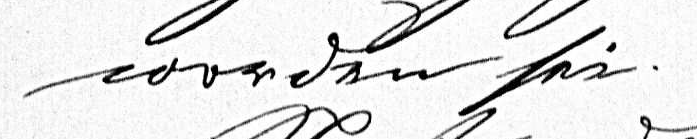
worden sei.
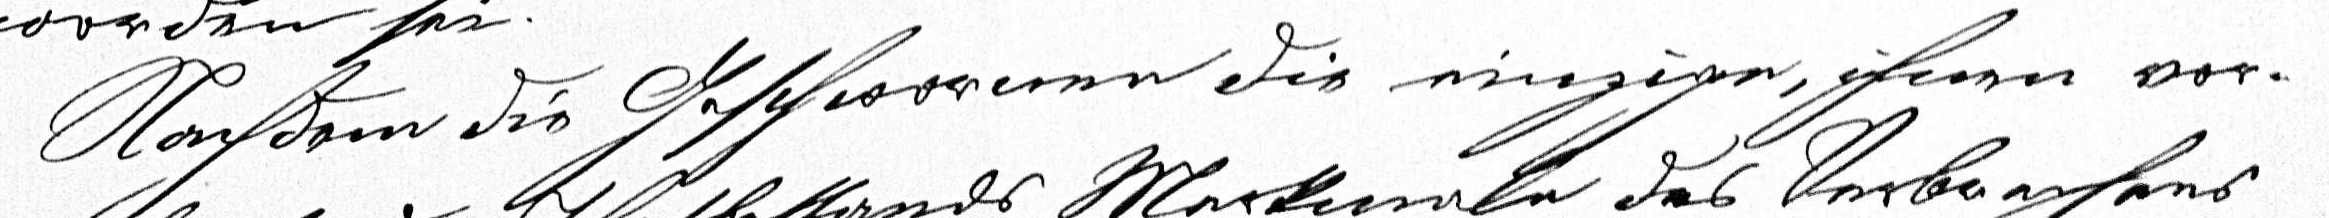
Nach dem die Geschworeme die einzige, ihrem vor¬
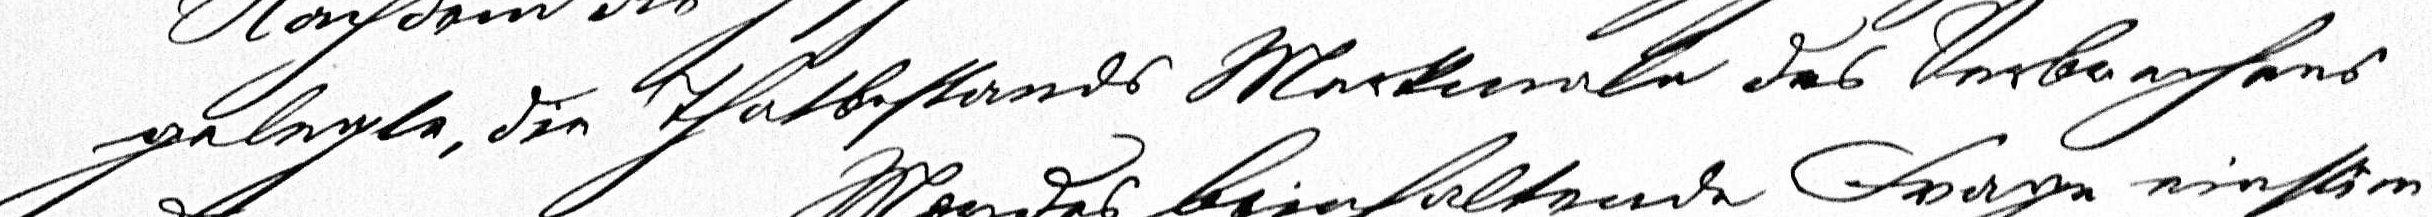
gelagte, die Thatbstands Markundle das Verbrachens
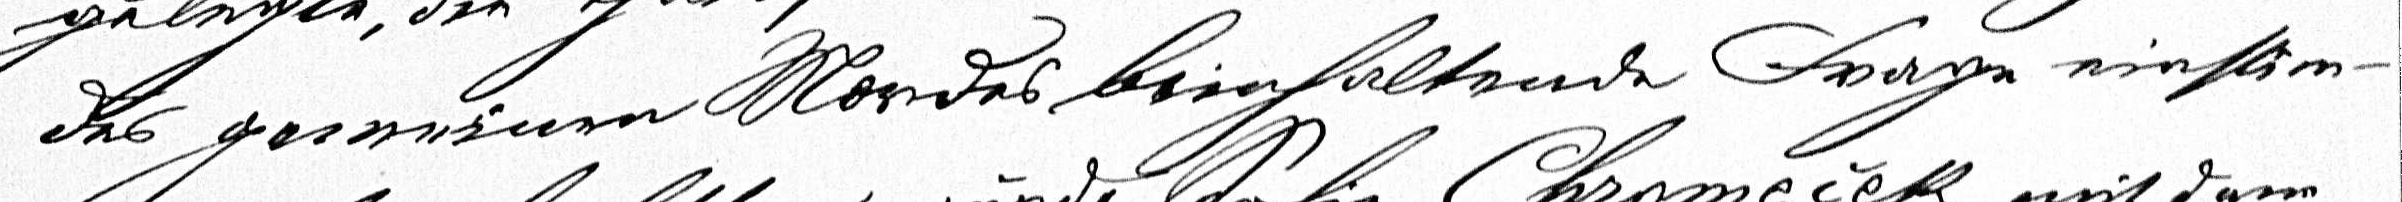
das gemeinen Mordes beinhaltende Frage eirstie¬
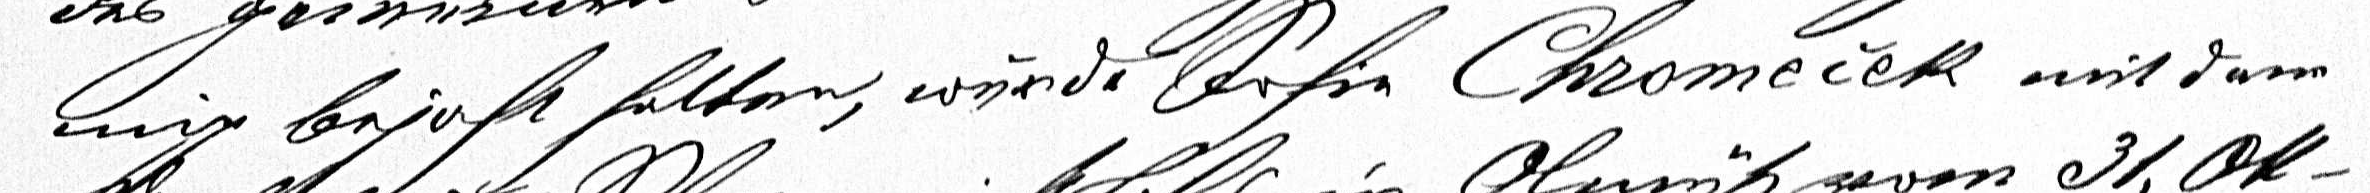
mig beiahr halten, wurde Sofie Chromecek mit dem
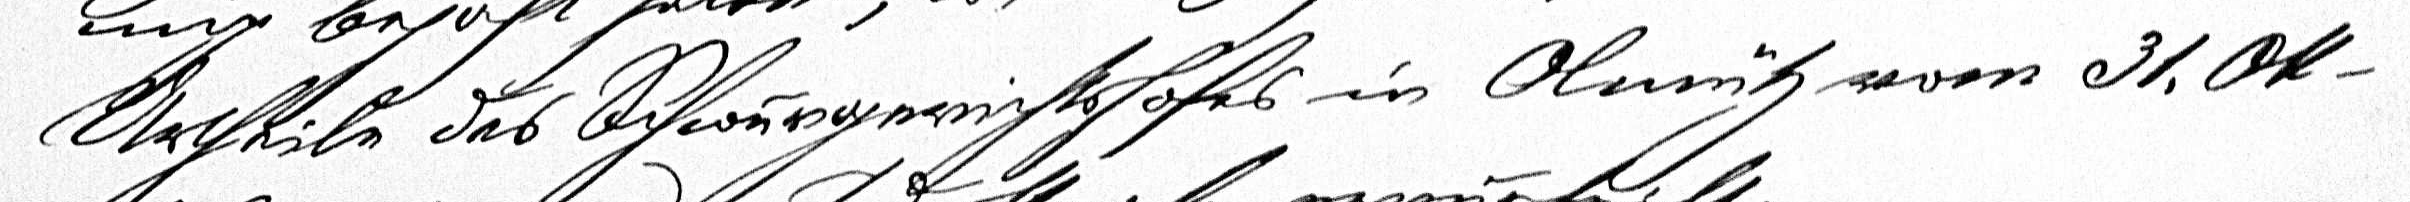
Artheile des Schwurgerinstshofes in Olmutz vom 31. Ok¬
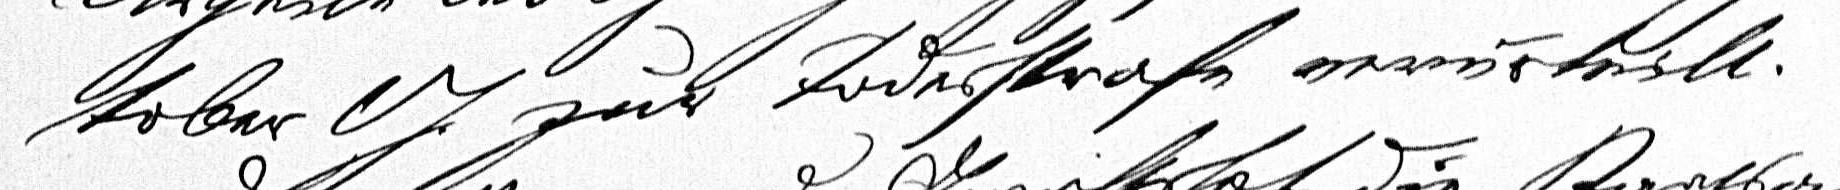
tober J. zur Todesstrafe vevurteilt.
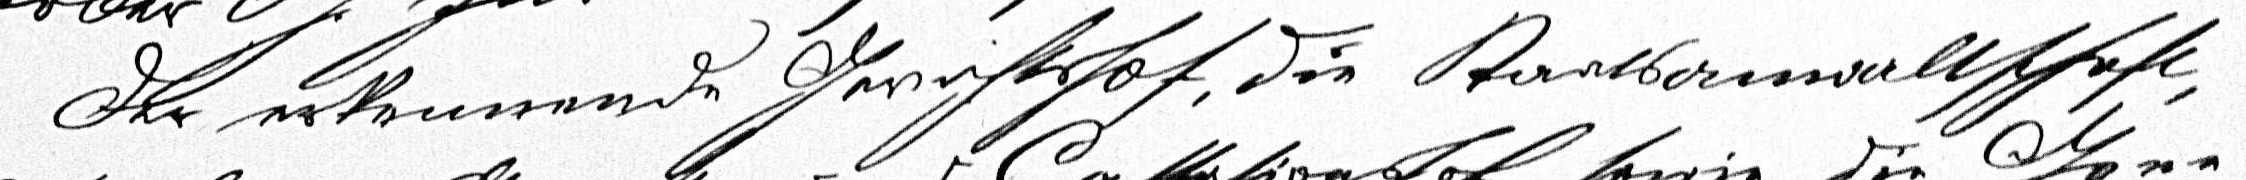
Der erkennende Gerchshof, die Startsamvaltschhoft,
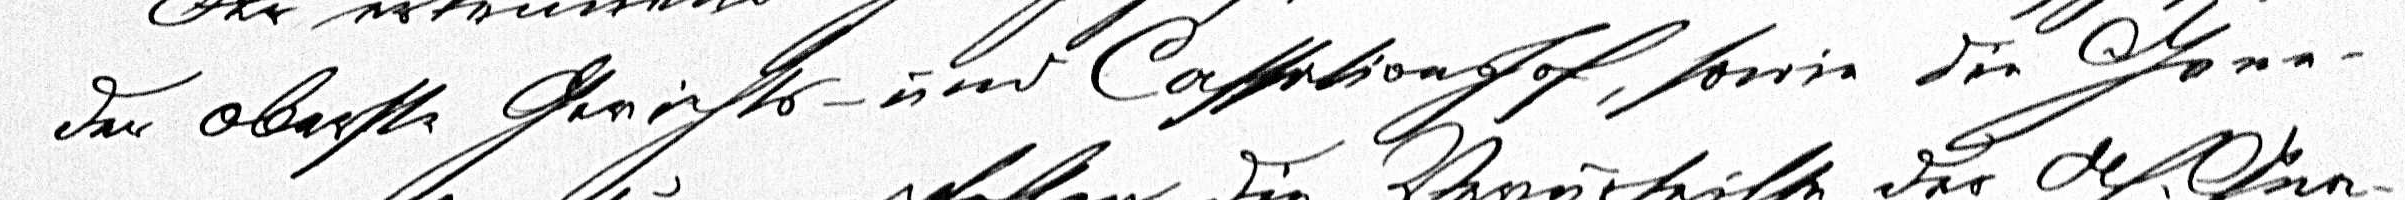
der oberste Gerichts- und Cassationhof, sowie die Gorr¬
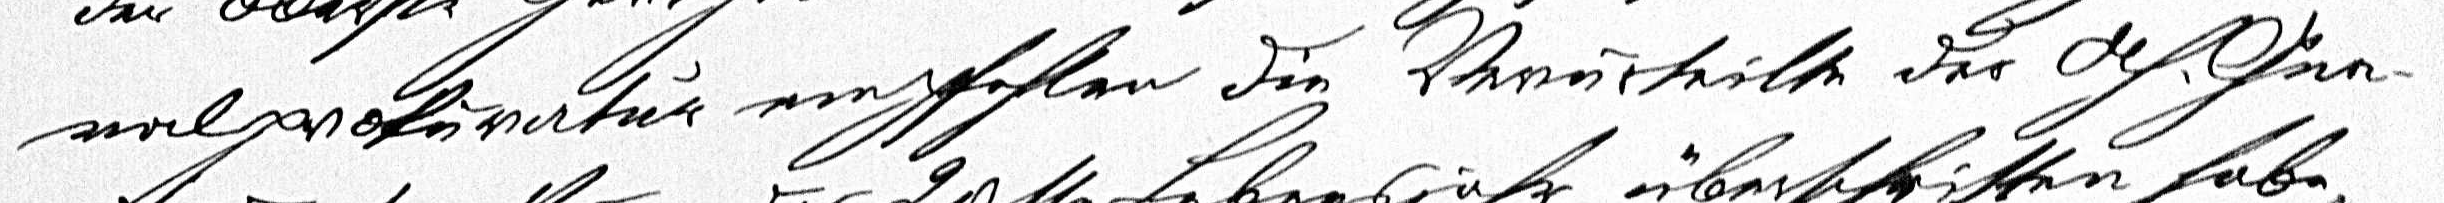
valprokuratur emchoften die Verurteille der G. Gur¬
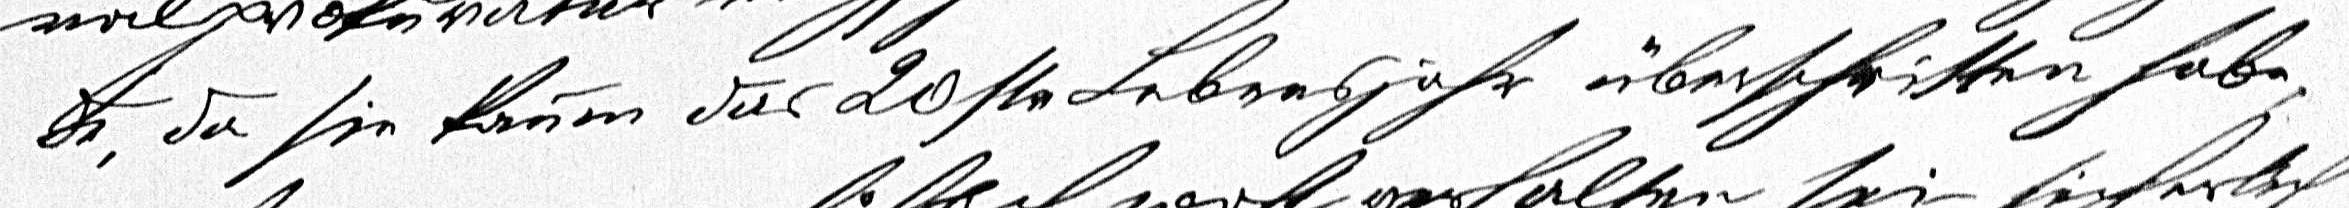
de, da sie Kaum das 20ste lebersjahr üerschritten habe
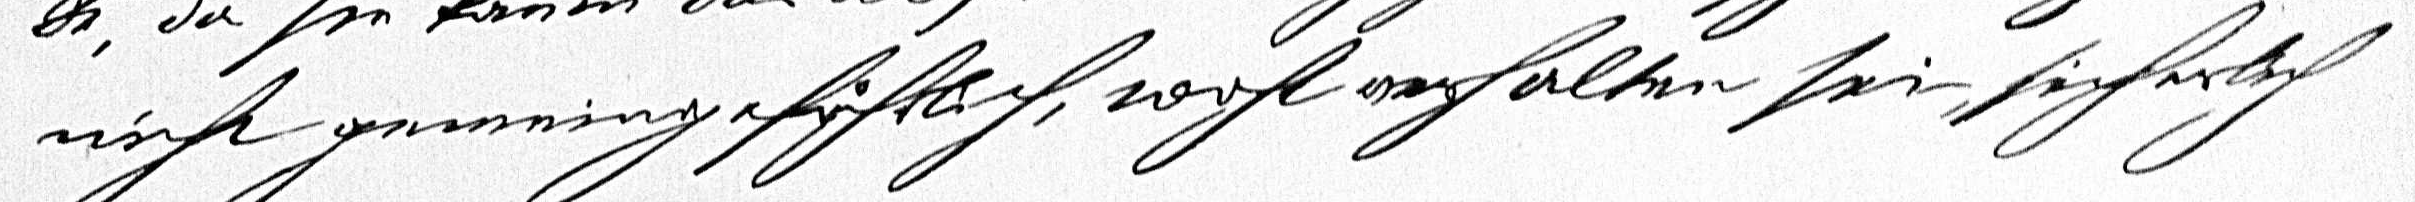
nicht gemeingeföhtich, wohl vehalten sei, sichertch
